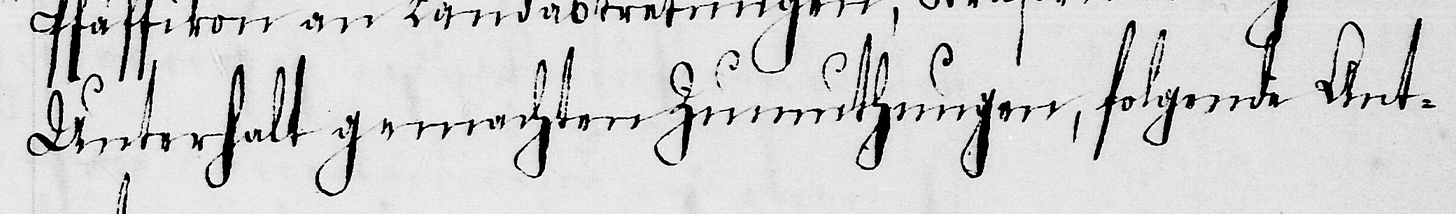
Unterhalt gemachten Zumuthungen, folgende Ant¬
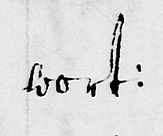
wort:
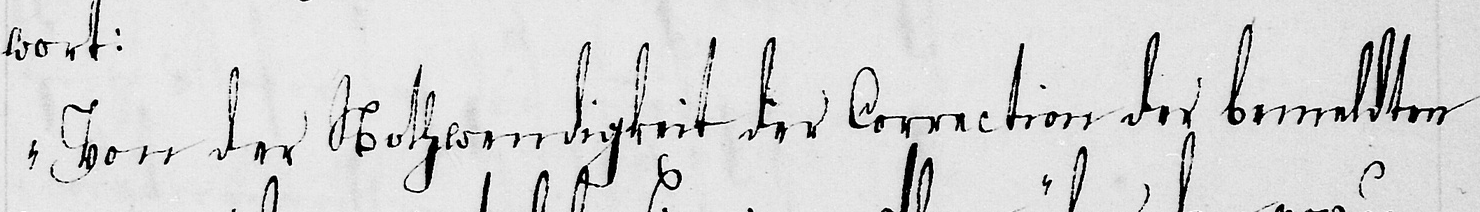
„Von der Nothwendigkeit der Correction der bemeldten
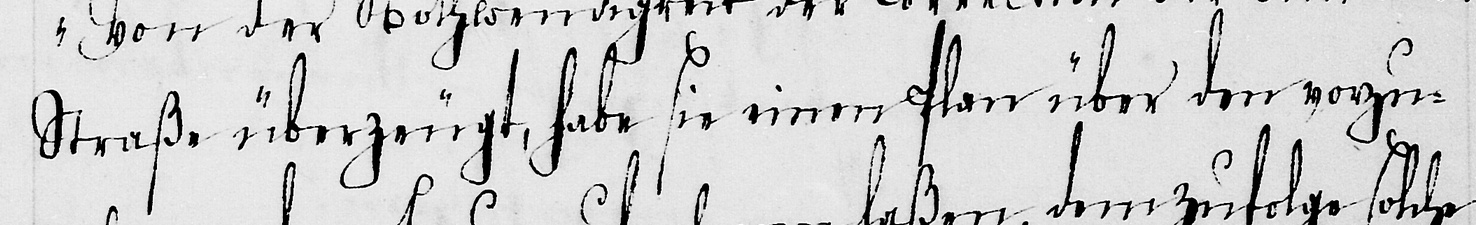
Straße überzeugt, habe sie einen Plan über den vorzu¬
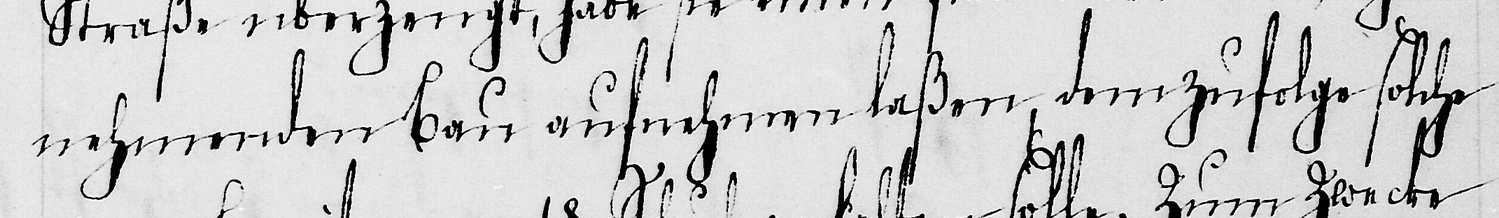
nehmenden Bau aufnehmen laßen, demzufolge solche
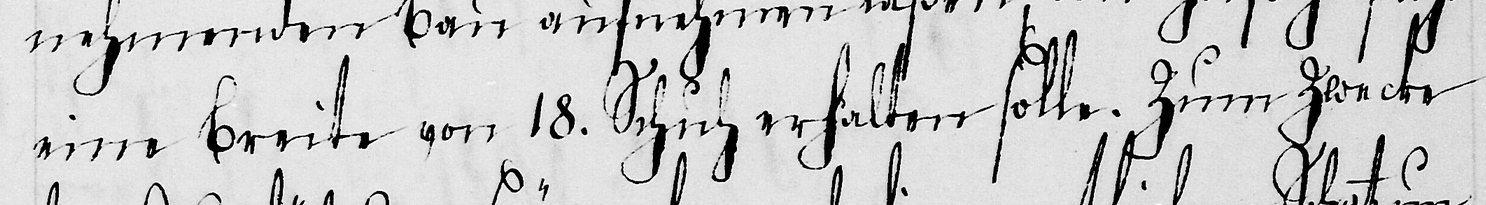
eine Breite von 18. Schuh erhalten solle. Zum Zwecke
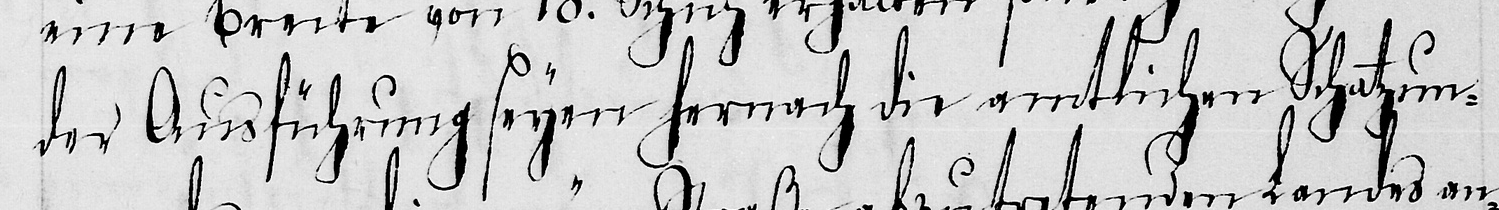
der Ausführung seyen hernach die amtlichen Schatzun¬
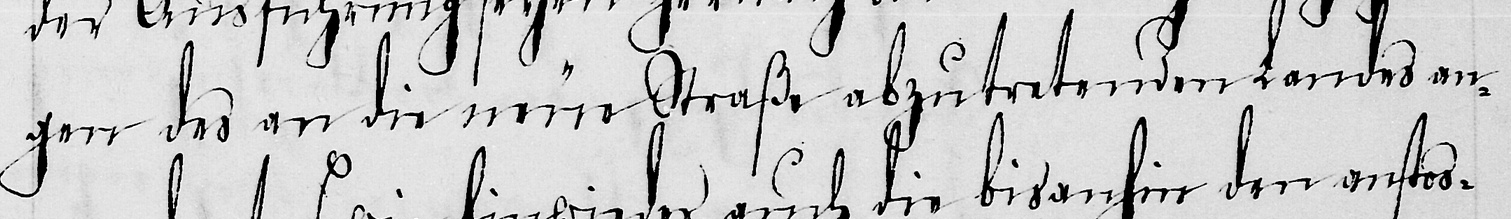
gen des an die neue Straße abzutretenden Landes an¬
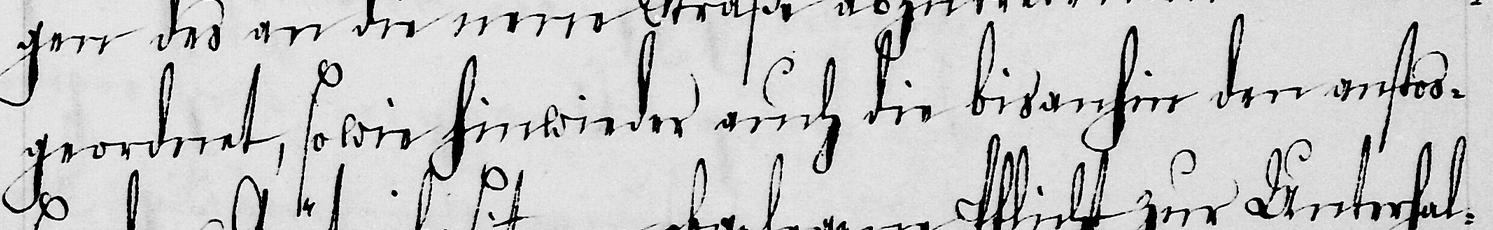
geordnet, sowie hinwieder auch die bisanhin den anstoß¬
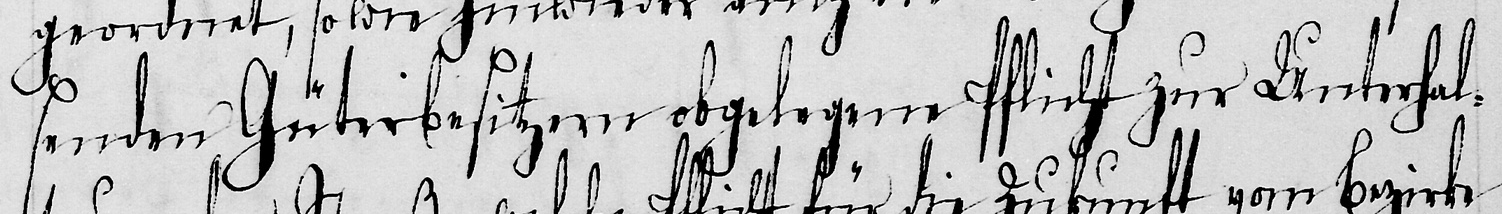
enden Güterbesitzern obgelegene Pflicht zur Unterhal¬
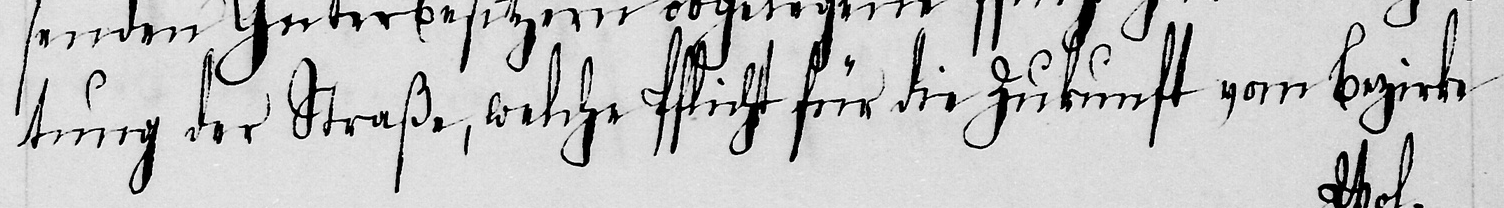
tung der Straße, welche Pflicht für die Zukunft vom Bezirke
